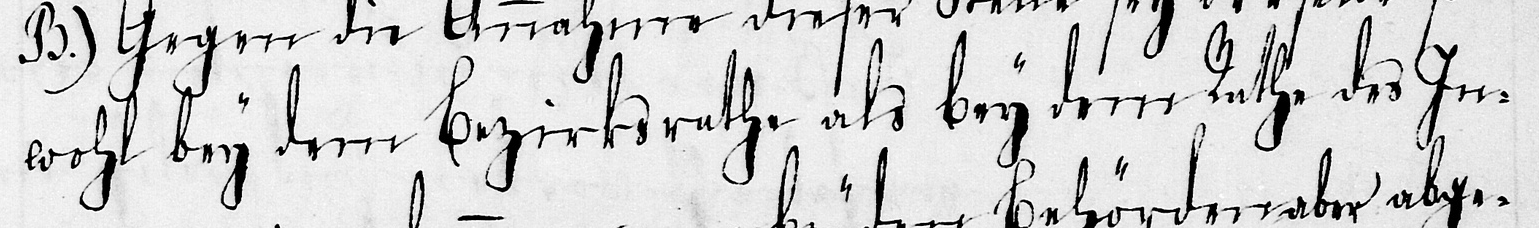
wohl bey dem Bezirksrathe als bey dem Rathe des In¬
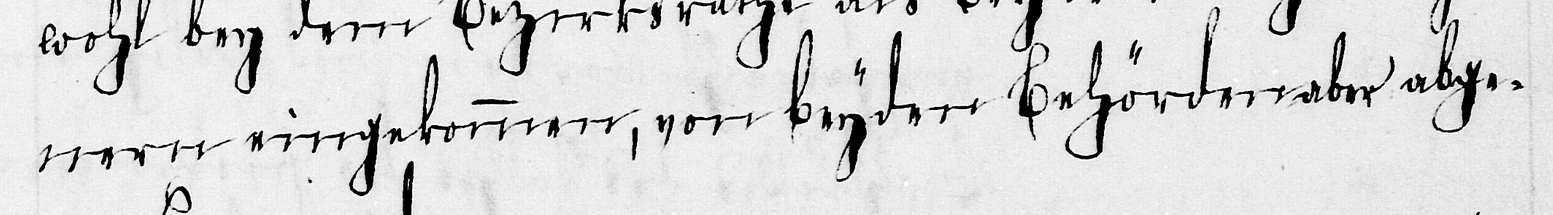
nern eingekommen, von beyden Behörden aber abge¬
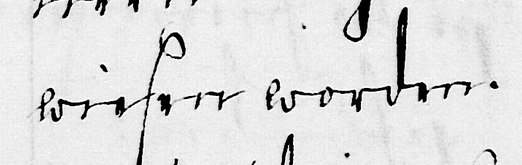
wiesen worden.
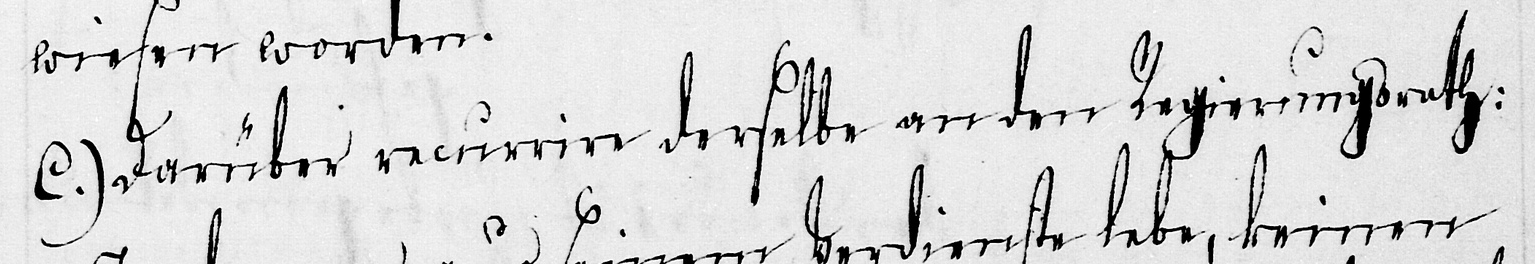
C.) Darüber recurrire derselbe an den Regierungsrath:
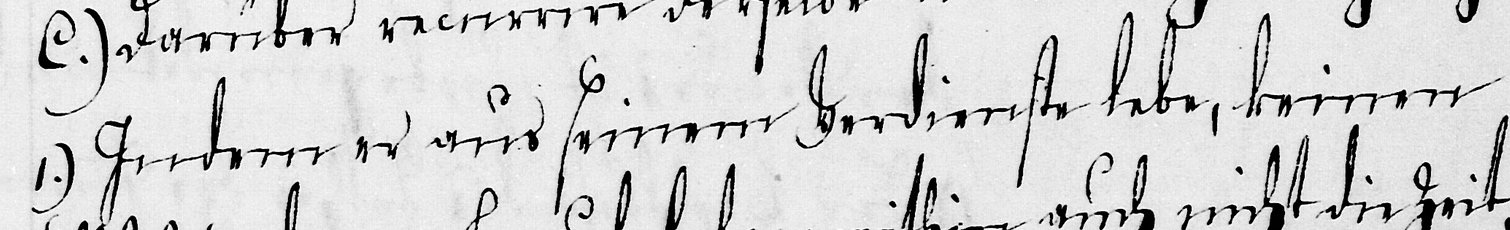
1.) Indem er aus seinem Verdienste lebe, keinen
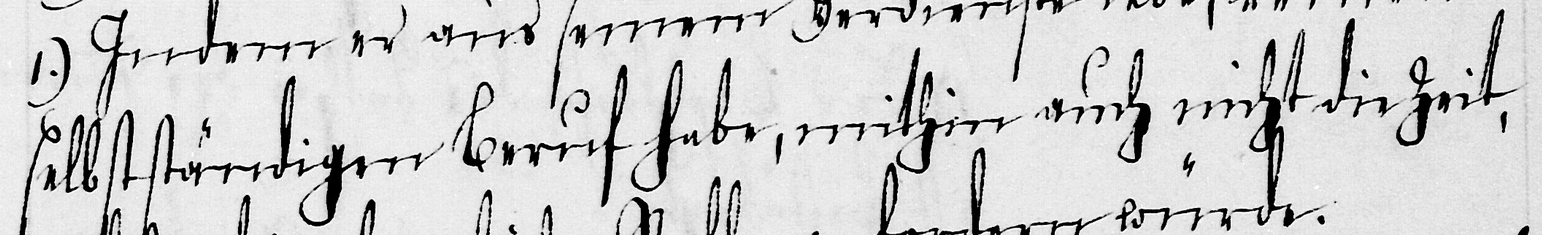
selbstständigen Beruf habe, mithin auch nicht die Zeit,
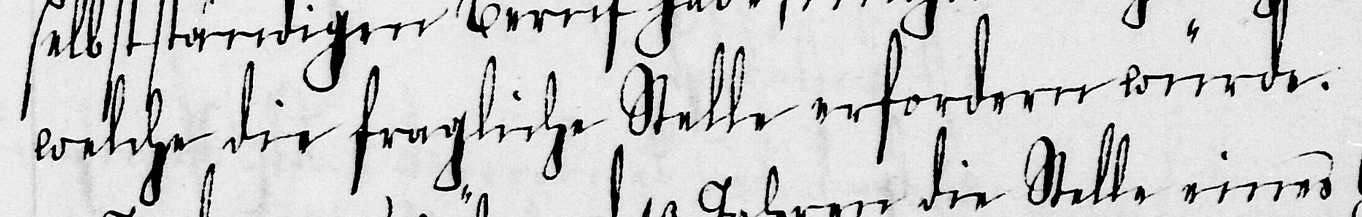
welche die fragliche Stelle erfordern würde.
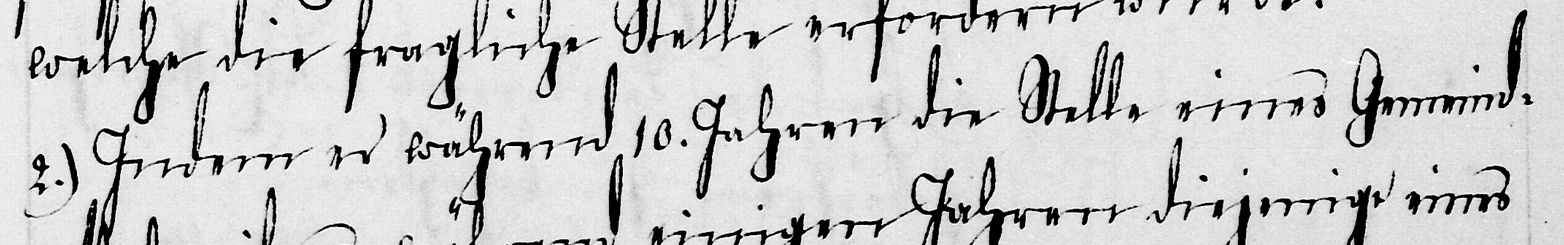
2.) Indem er während 10. Jahren die Stelle eines Gemeind¬
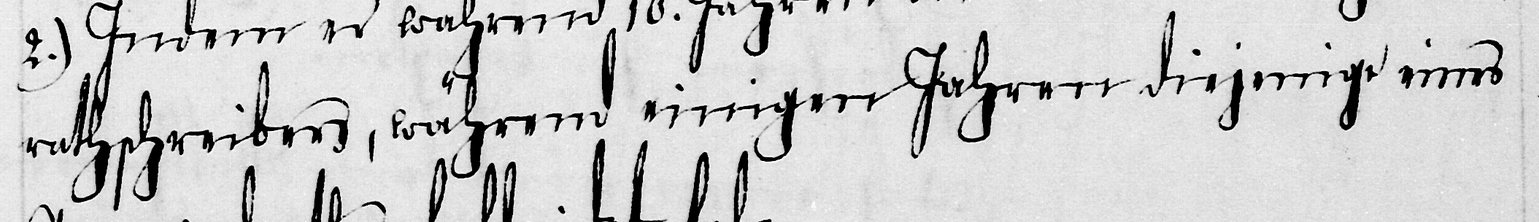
rathschreibers, während einigen Jahren diejenige eines
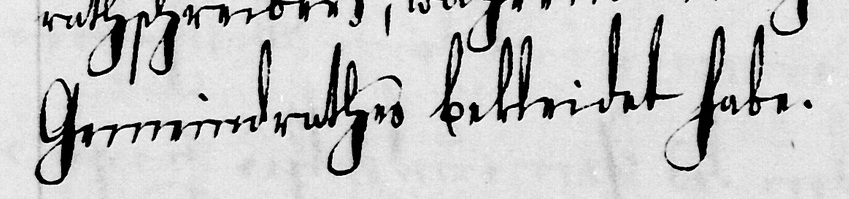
Gemeindrathes bekleidet habe.
